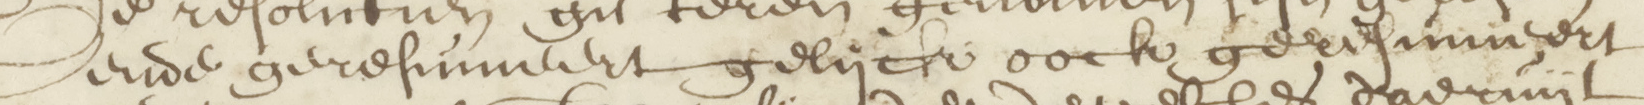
ende geresumeert gelijck oock geresumeert
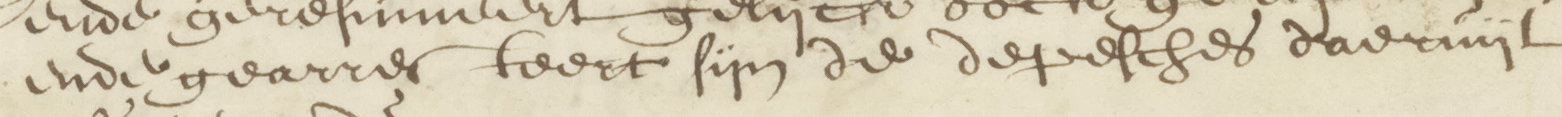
ende gearresteert sijn de depesches daeruijt
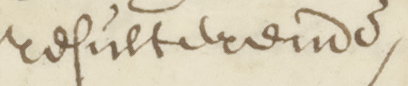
resulterende.
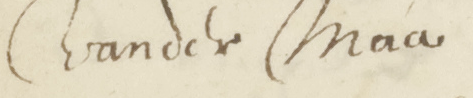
Vander Maa
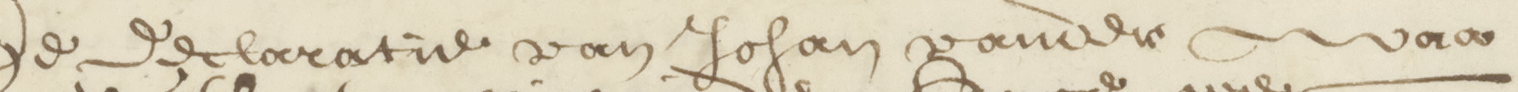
De declaratie van Johan van der Maa
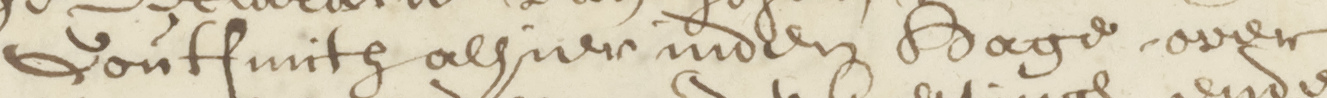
Goutsmith alhier inden Hage over
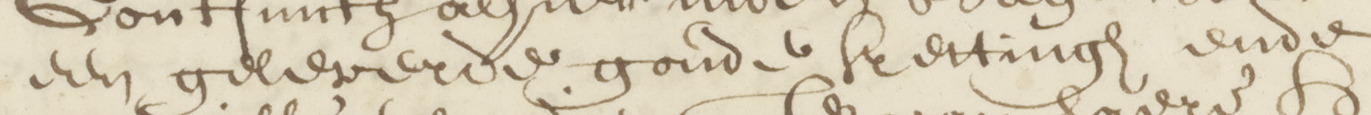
een geleverde goude kettingh ende
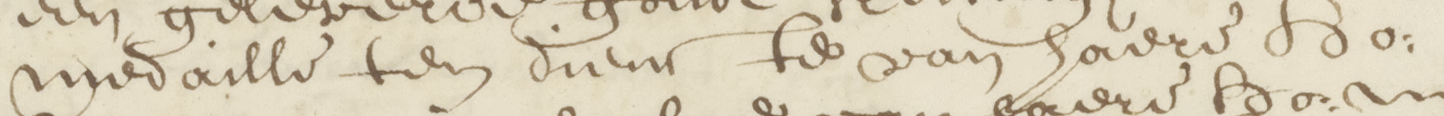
medaille ten dienste van haere Ho:
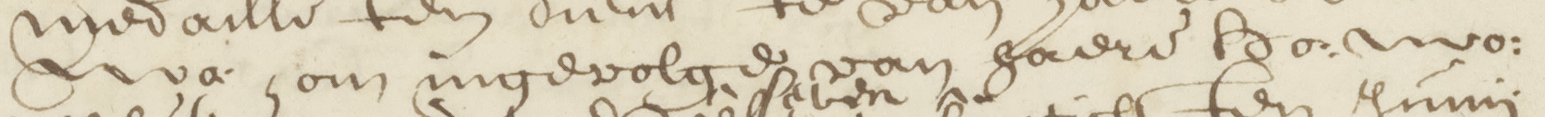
Mo:, om ingevolge van haere Ho:Mo:
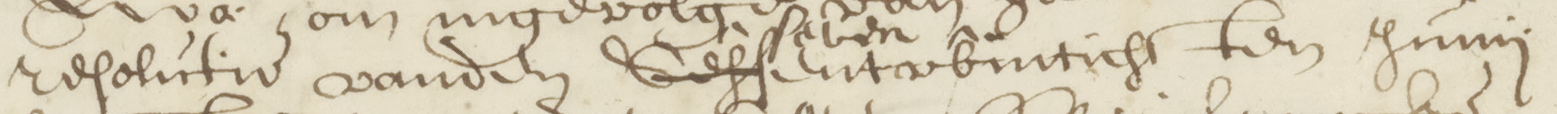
resolutie vanden Sess sevenentwintichsten Junij
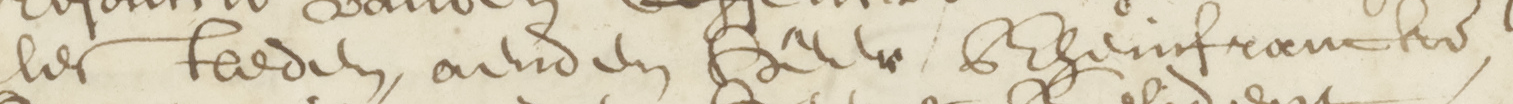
lestleden, aenden Heere Rheinfrancke,
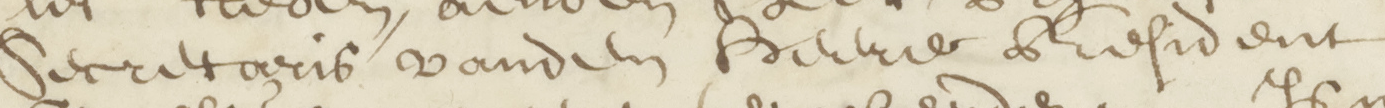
Secretaris vanden Heere Resident
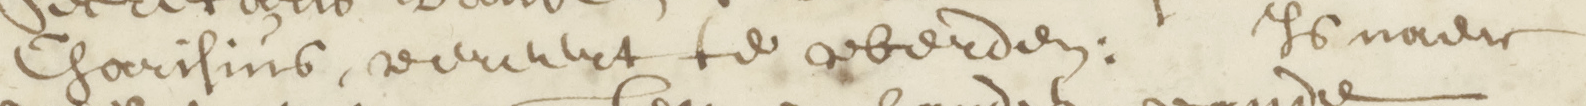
Charisius vereert te werden: Is naer
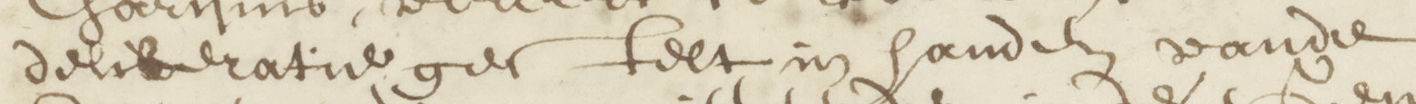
deliberatie gestelt in handen vande
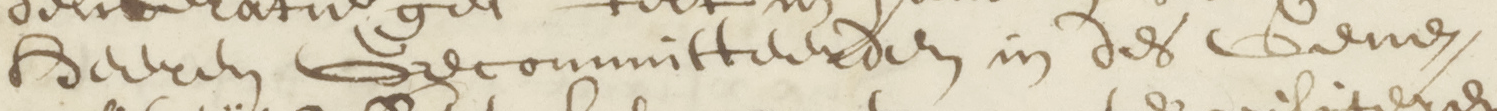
Heeren Gecommitteerden in des Gene„
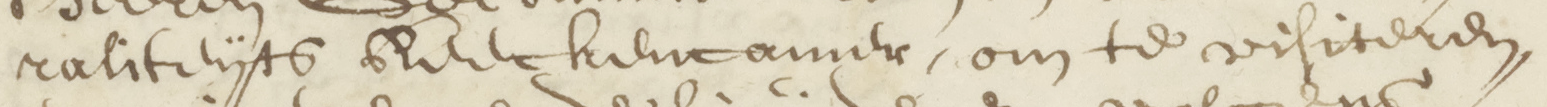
raliteijts Reeckencamer, om te visiteren,
